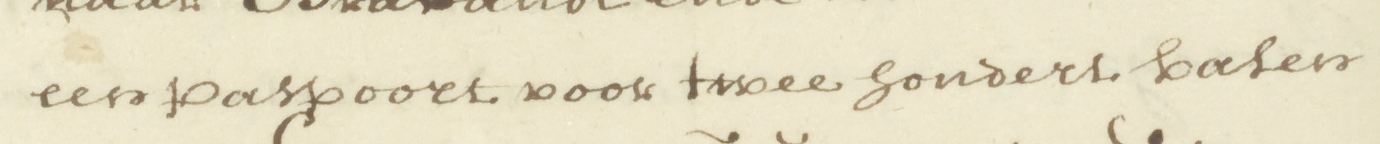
een paspoort voor twee hondert balen
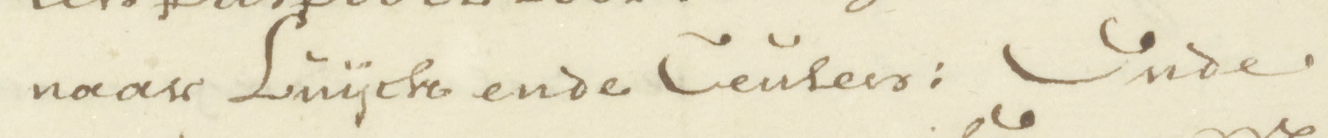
naar Luijck ende Ceulen: Ende
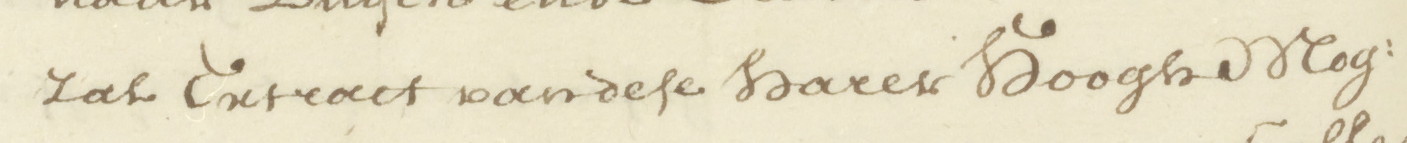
zal Extract van dese harer Hooghe Mog:
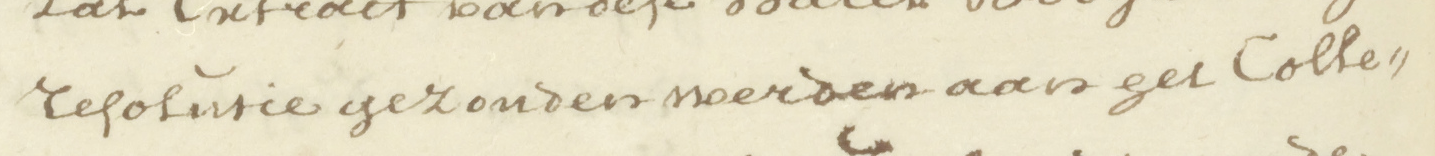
resolutie gezonden werden aan het Colle„
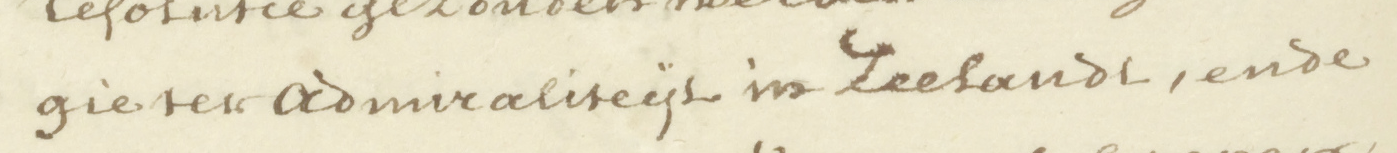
gie ter Admiraliteijt in Zeelandt, ende
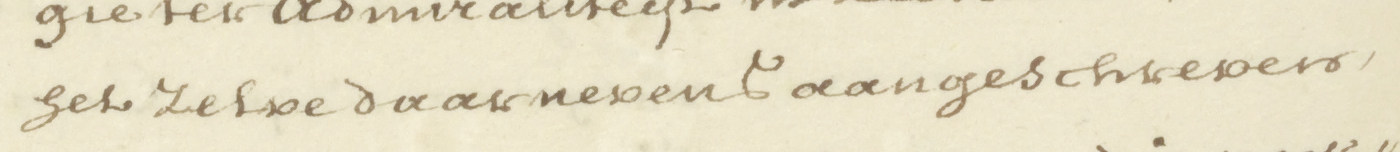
het zelve daarnevens aangeschreven
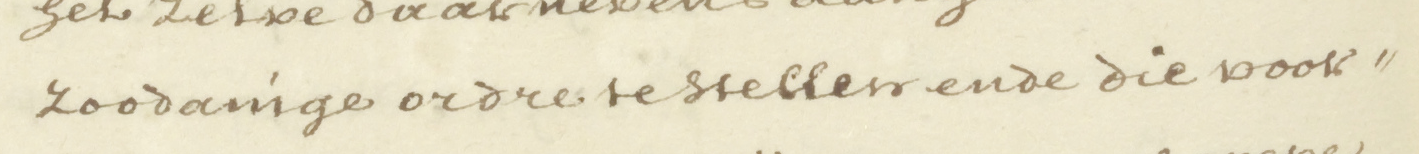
zoodanige ordre te stellen ende die voor„
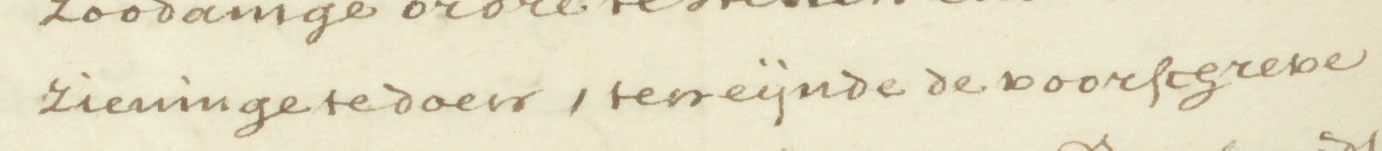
zieninge te doen, ten eijnde de voorschreve
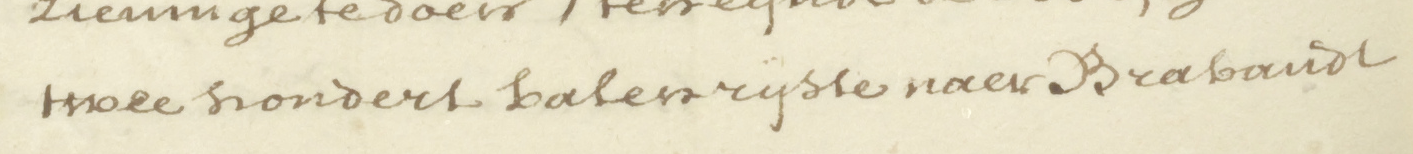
twee hondert balen rijste naer Brabandt
